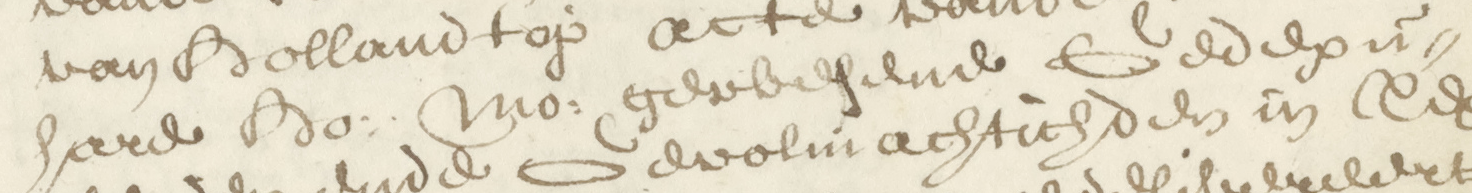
hare Ho:Mo: gewesene Gedepu„
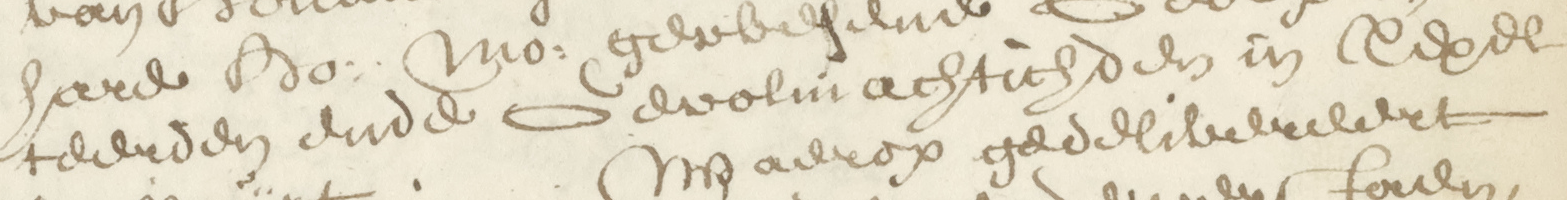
teerden ende Gevolmachtichden in Texel
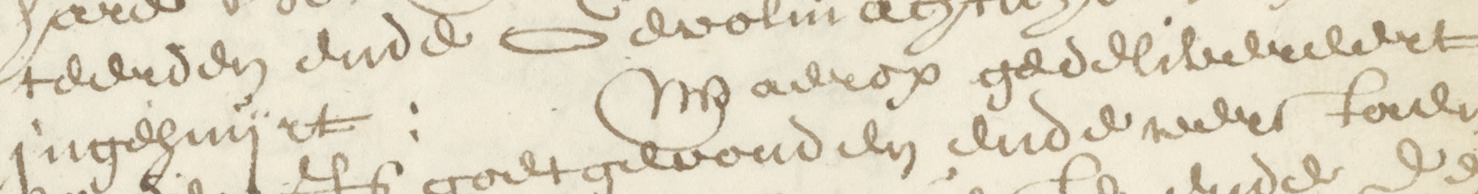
ingehuijrt: Waerop gedelibereert
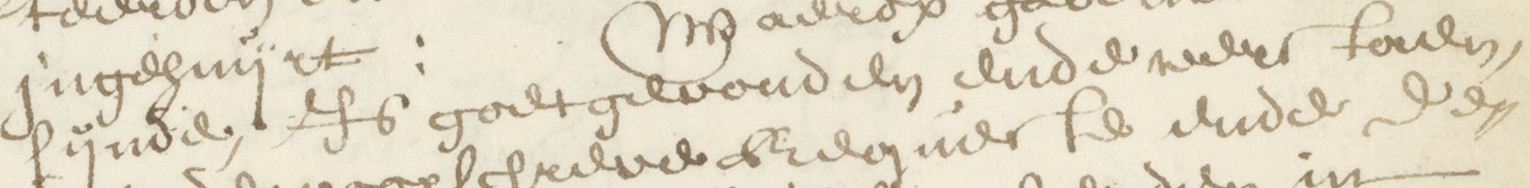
sijnde, is goetgevonden ende verstaen,
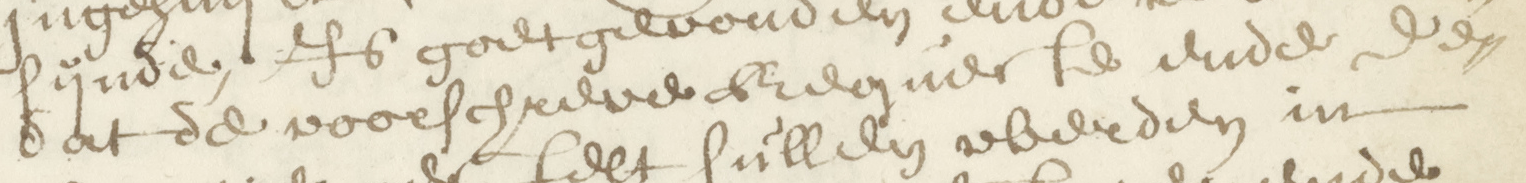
dat de voorschreve Requeste ende de„
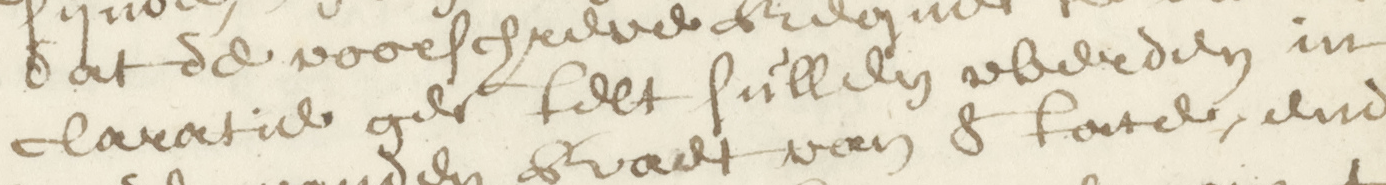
claratie gestelt sullen werden in
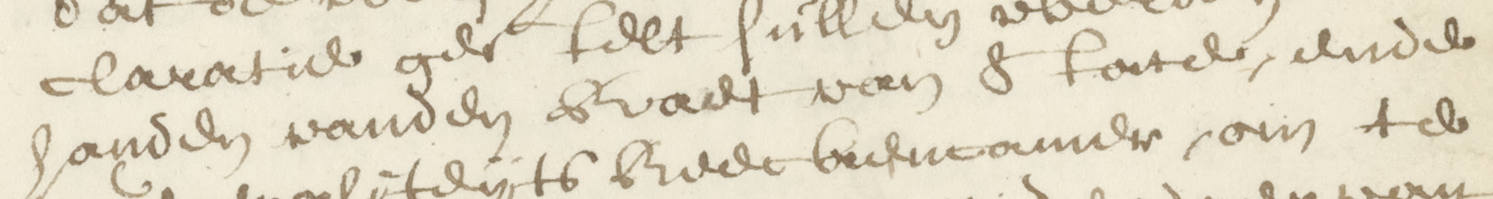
handen vanden Raet van State, ende
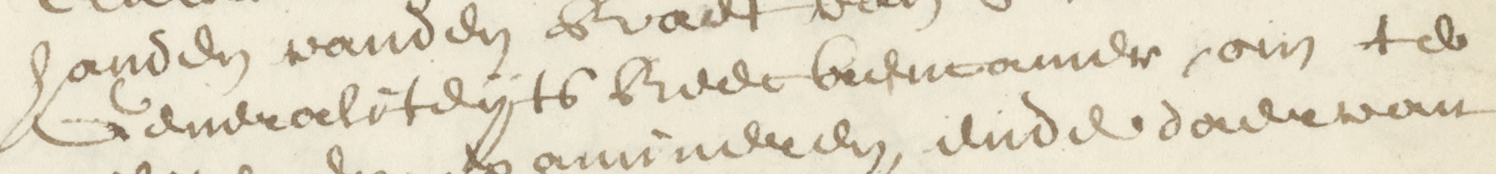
Generaliteijts Reeckencamer, om te
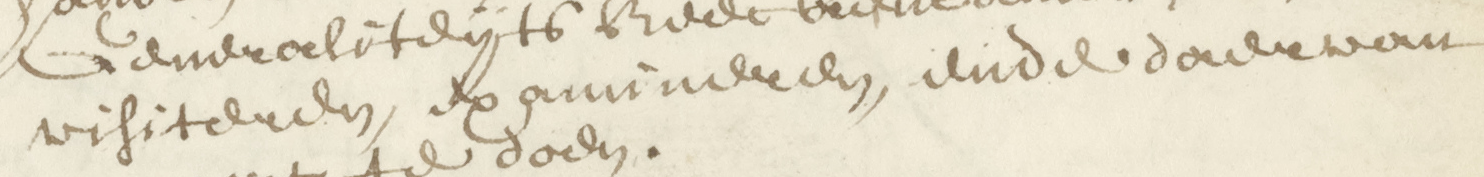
visiteren, examineren, ende daervan
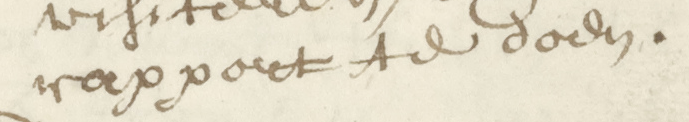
rapport te doen.
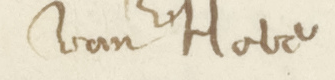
van Hove
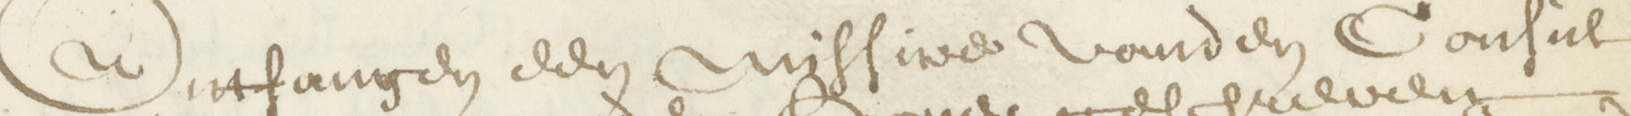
Ontfangen een missive vanden consul
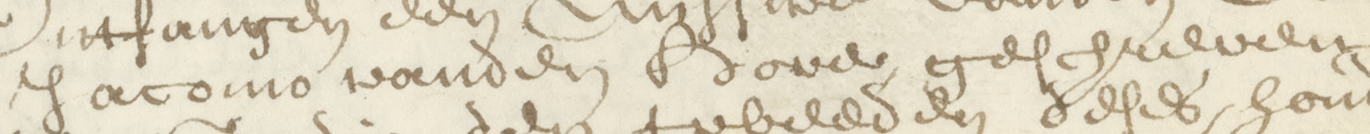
Jacomo vanden Hove geschreven
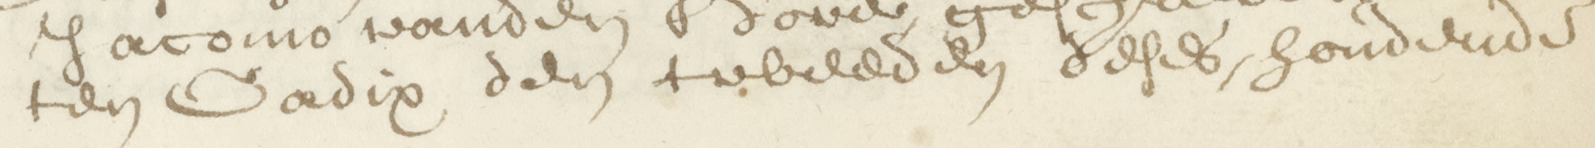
ten Cadix, den tweeden deses, houdende
